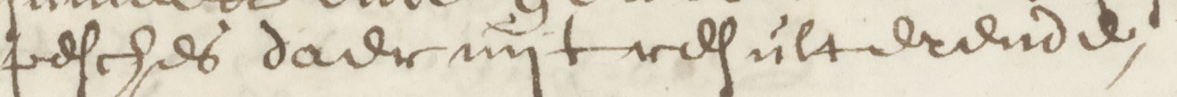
pesches daer uijt resulterende.
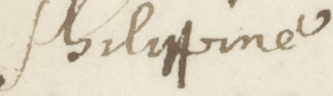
Philippine
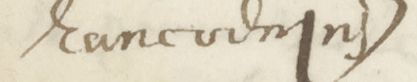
rancoenpn
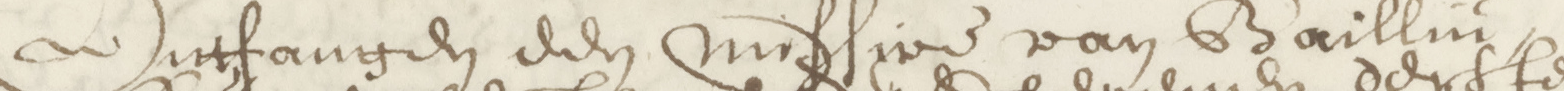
Ontfangen een missive van Bailliu,
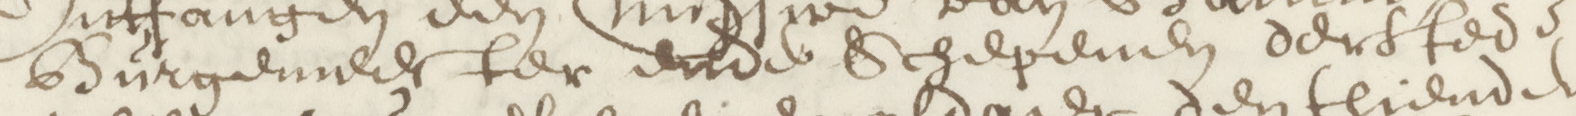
Burgemeester ende Schepenen der Stede
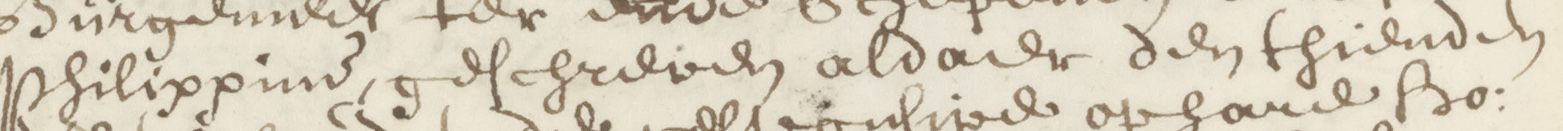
Philippine, geschreven aldaer den thienden
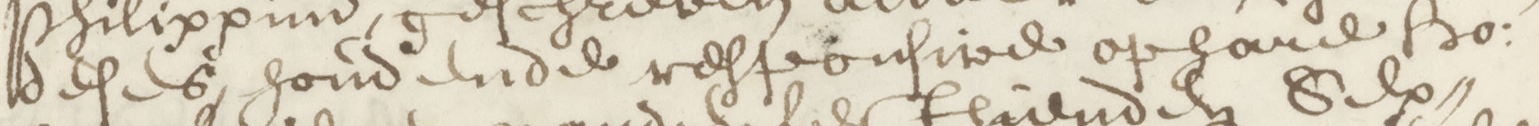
deses, houdende responsive op hare Ho:
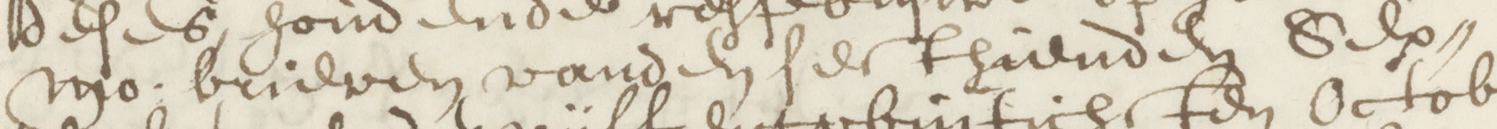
Mo: brieven vanden sesthienden Sep,,
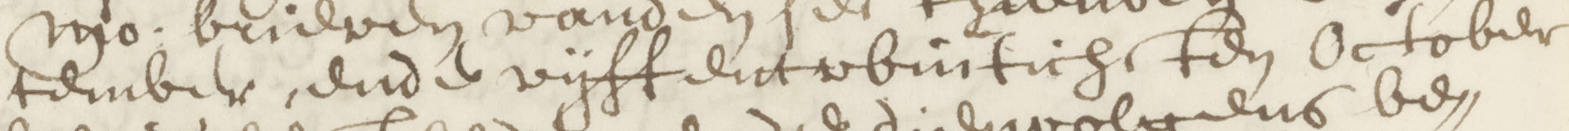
tember, ende vijffentwintichsten October
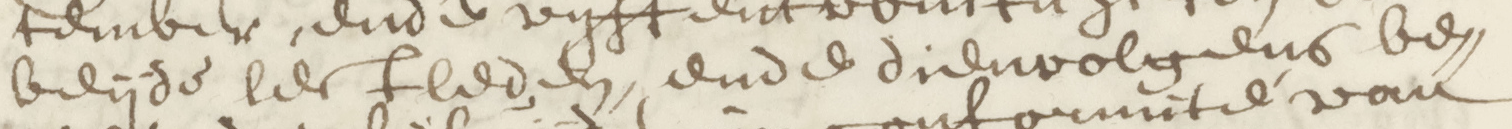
beijde lestleden, ende dienvolgens be,,
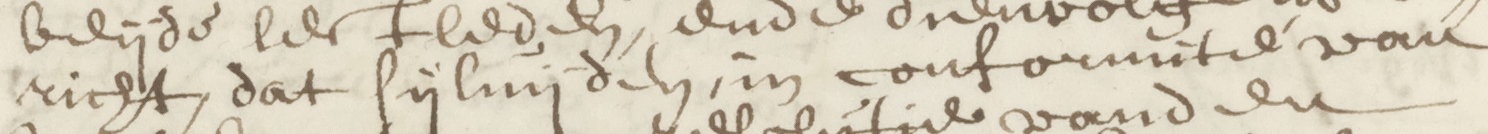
richt, dat sijluijden, in conformité van
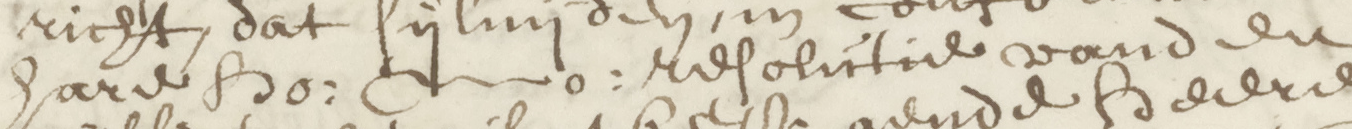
hare Ho:Mo: resolutie vanden
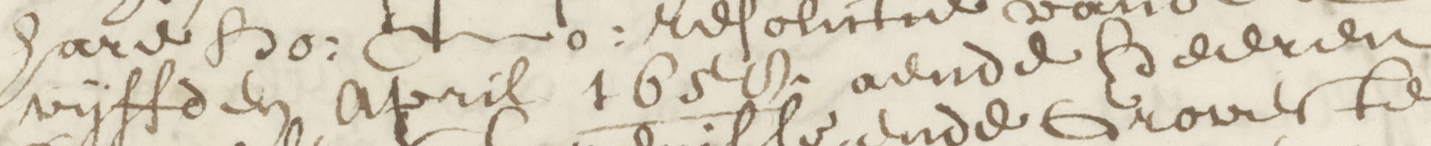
vijffden april 1658 aende Heeren
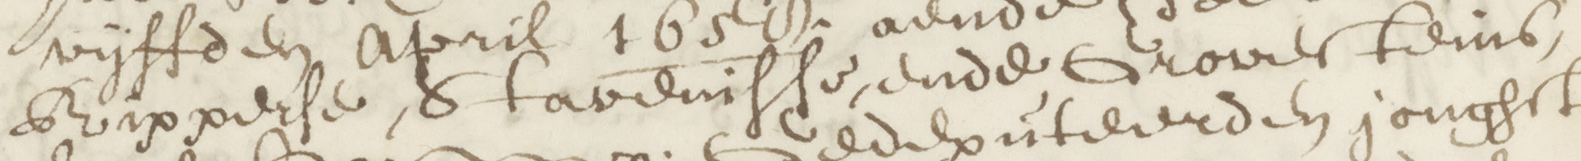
Ripperse, Stavenisse, ende Grovesteins,
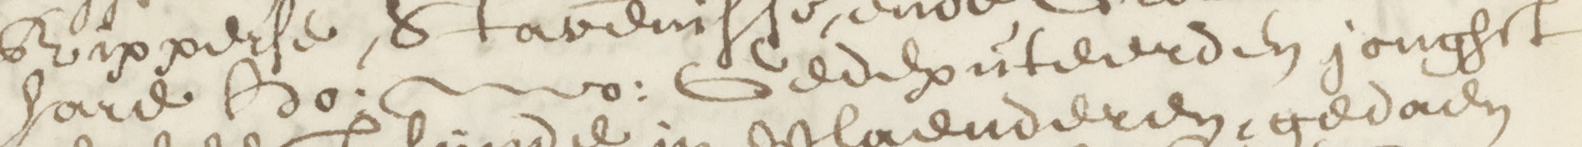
hare Ho:Mo: Gedeputeerden jonghst
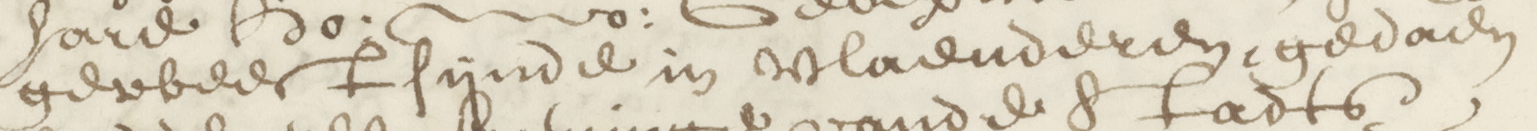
geweest sijnde in Vlaenderen, gedaen
